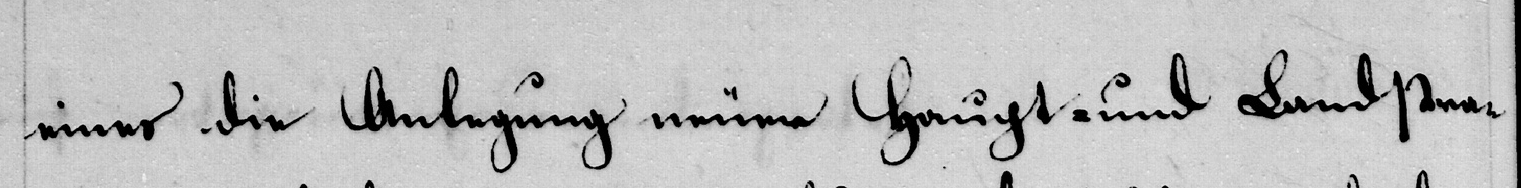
eines die Anlegung neuer Haupt- und Landstra¬
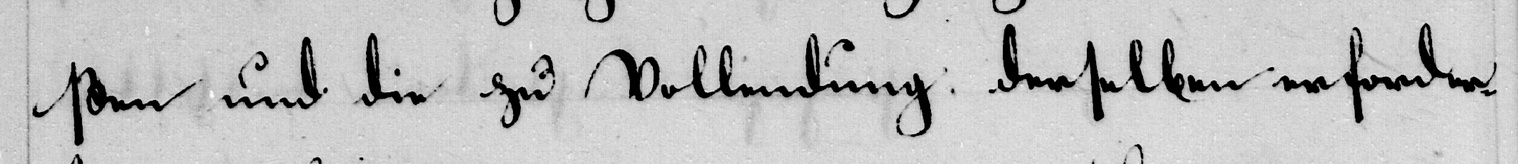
ßen und die zu Vollendung derselben erforder¬
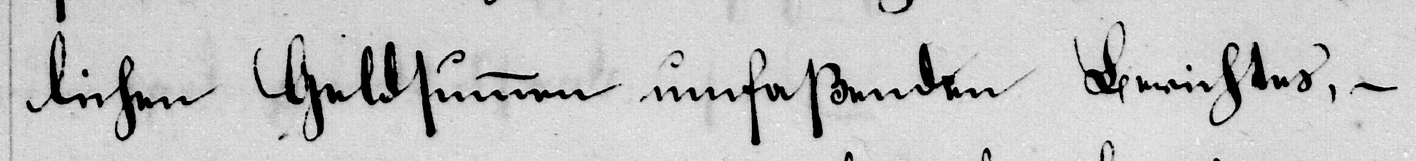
lichen Geldsummen umfaßenden Berichtes, –
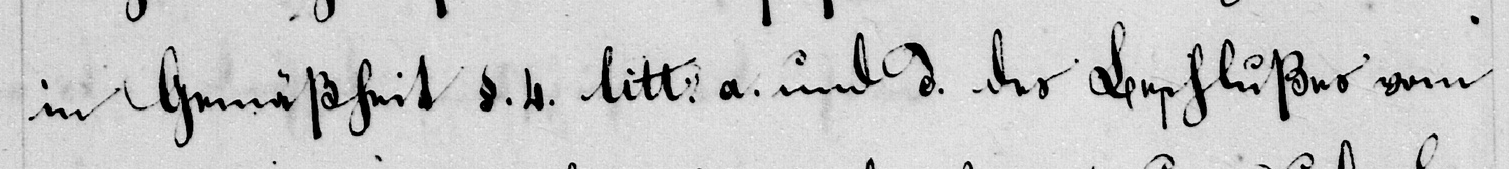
in Gemäßheit §. 4. litt: a. und d. des Beschlußes vom
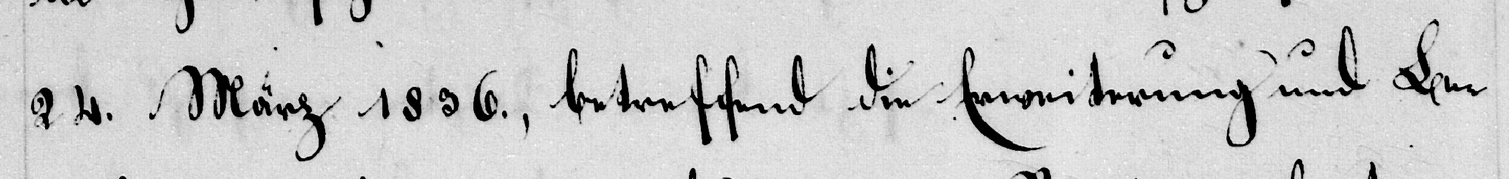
24. März 1836., betreffend die Erweiterung und Be¬
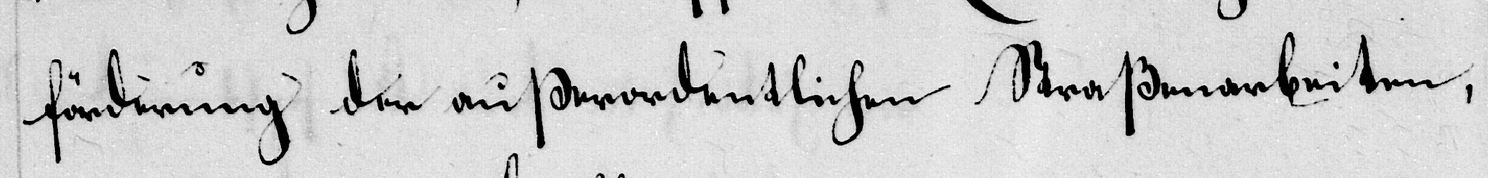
förderung der außerordentlichen Straßenarbeiten,
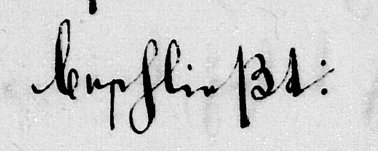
beschließt:
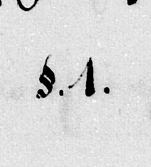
§.1.
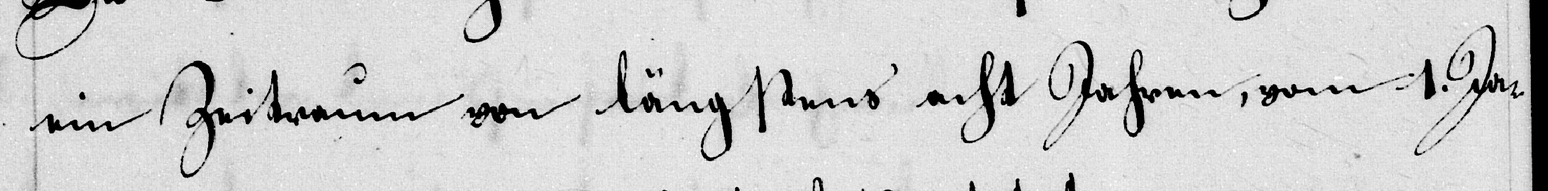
ein Zeitraum von längstens acht Jahren, vom 1. Ja¬
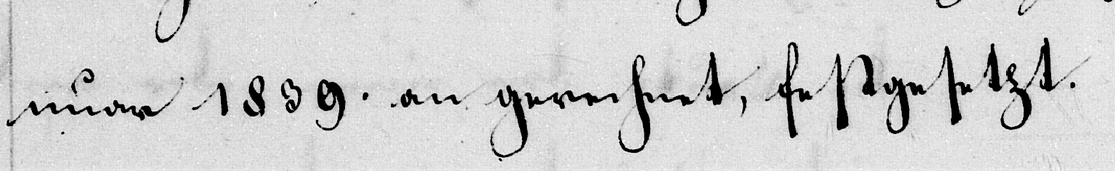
nuar 1839. an gerechnet, festgesetzt.
